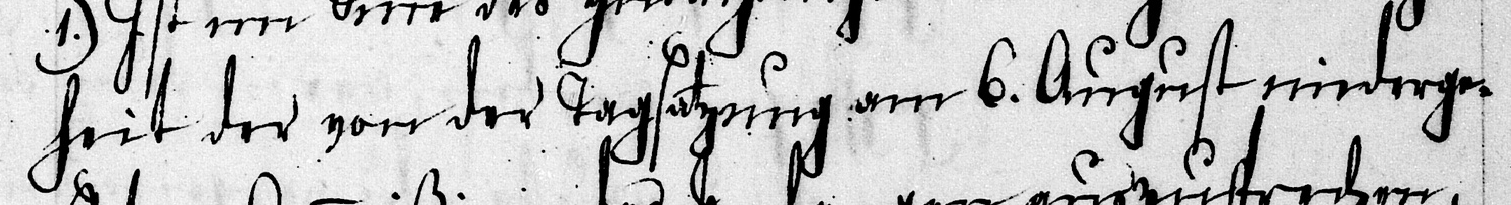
heit der von der Tagsatzung am 6. August niederge¬
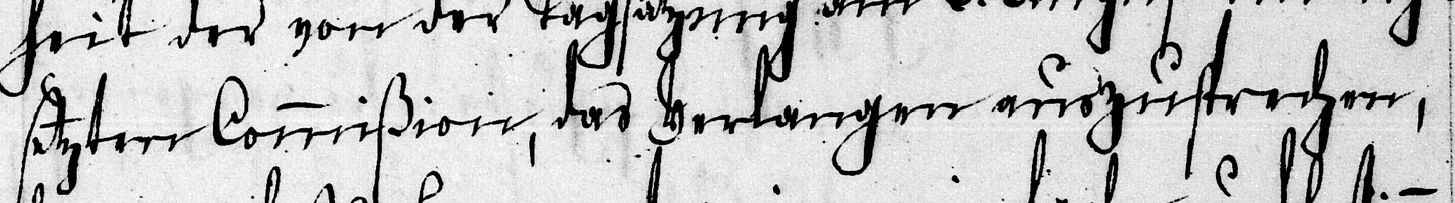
setzten Commißion, das Verlangen auszusprechen,
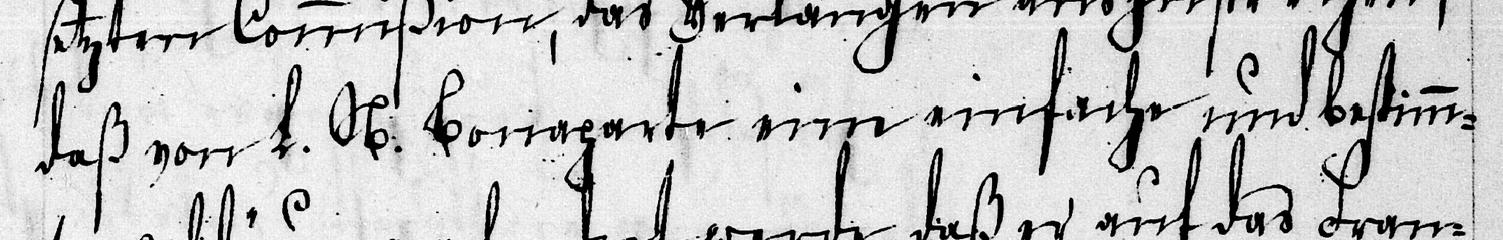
daß von L. N. Bonaparte eine einfache und bestim¬
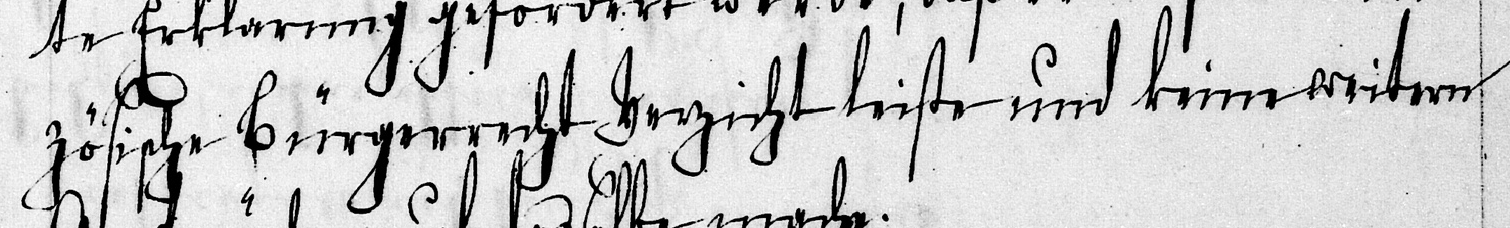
zösische Bürgerrecht Verzicht leiste und keine weitern
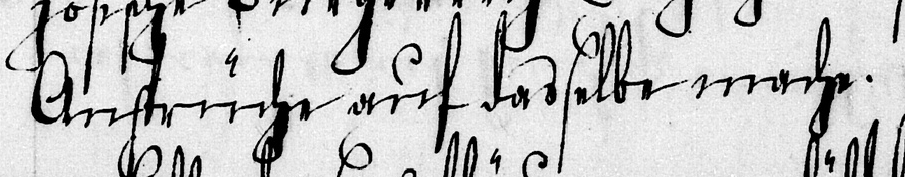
Ansprüche auf dasselbe mache.
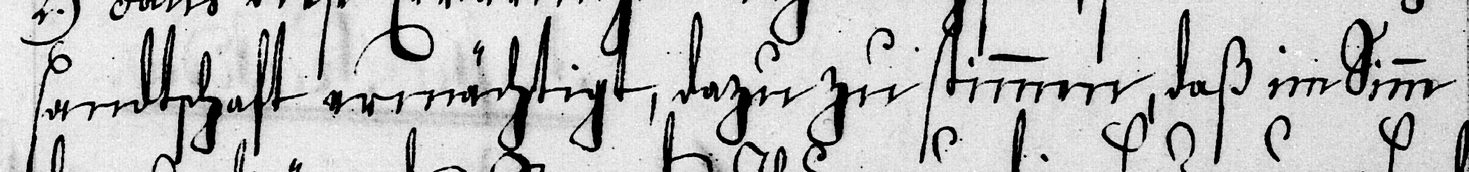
sandtschaft ermächtigt, dazu zu stimmen, daß im Sinne
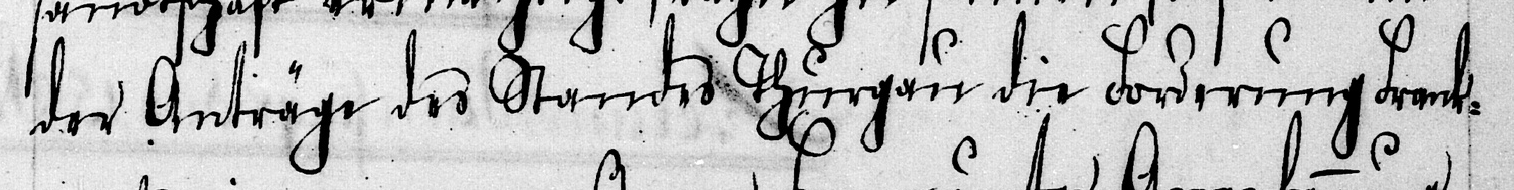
der Anträge des Standes Thurgau die Forderung Fran¬
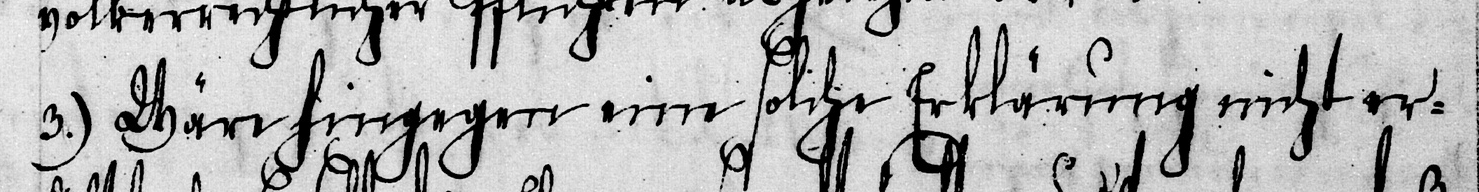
3.) Wäre hingegen eine solche Erklärung nicht er¬
